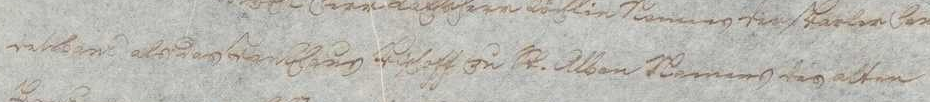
delsbank als das bankhaus Bischoff zu St. Alban Namens des alten
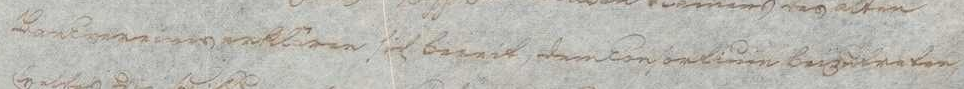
Bankvereines erklären sich bereit, dem Consortium beizutreten,
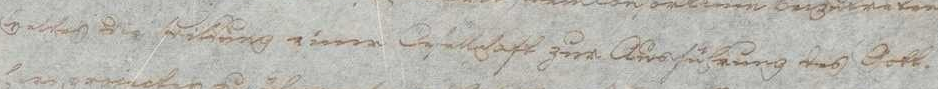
welches die Bildung einer Gesellschaft zur Ausführung des Gott-
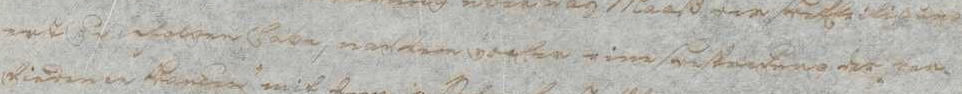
erst zu erfolgen habe, nachdem vorher eine Besprechung der ver-
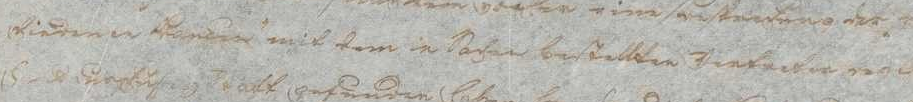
schiedenen Banken mit dem in Sachen bestellten Vertreter des
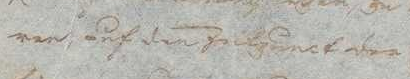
ren, auf den Zeitpunct der
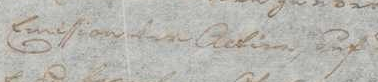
Emission der Actien, auf die
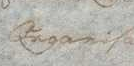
Organisa-
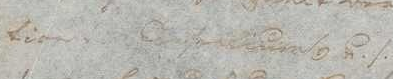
tion des Consortiums u. s.
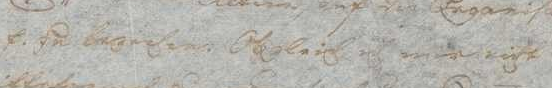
f. zu beziehen. Obgleich ich mir nicht
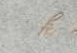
denken
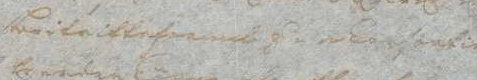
Beitrittsformel zum Consortium zur
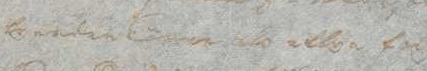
werden könne als etwa folgendermaßen:
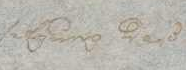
der Voraussetzung,
